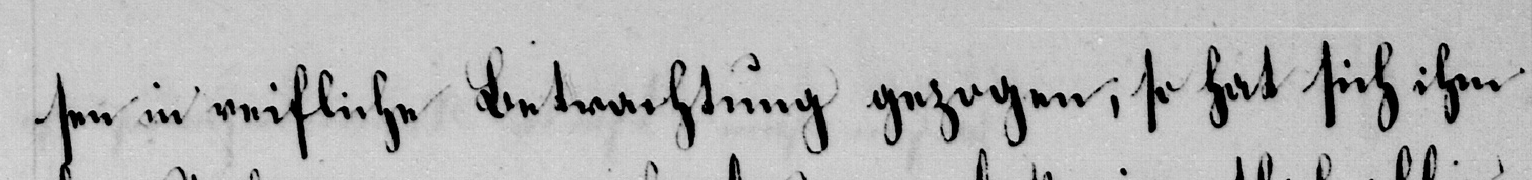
sen in reifliche Betrachtung gezogen, so hat sich ihm
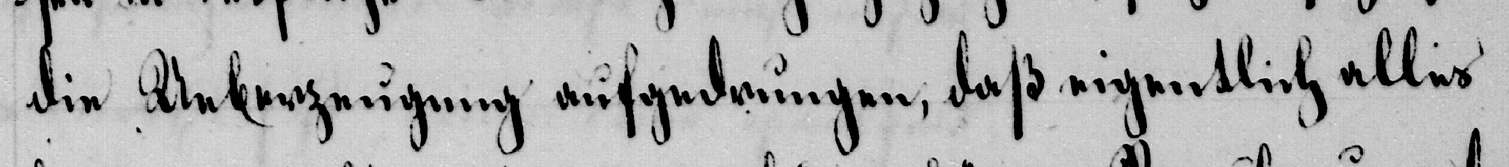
die Ueberzeugung aufgedrungen, daß eigentlich alles
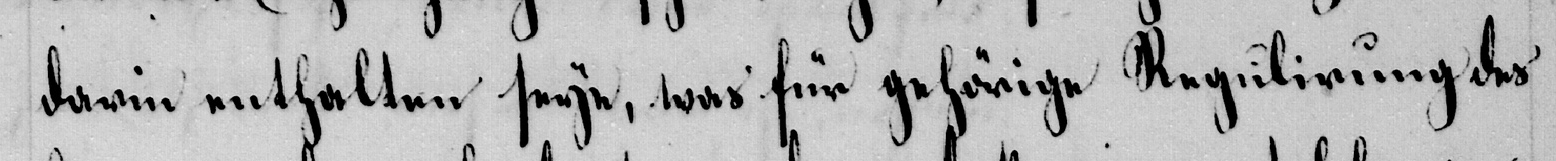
darin enthalten seye, was für gehörige Regulirung des
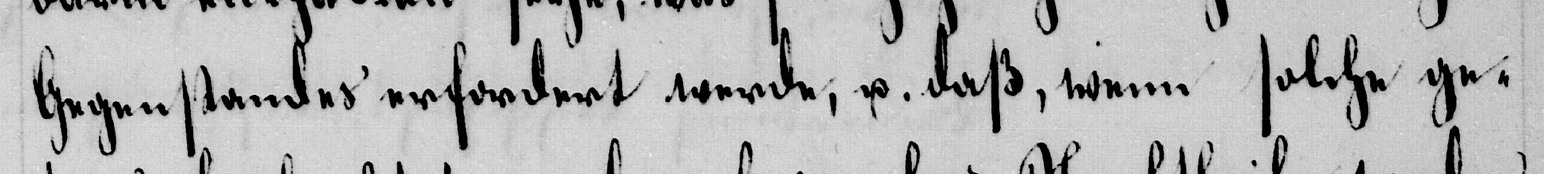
Gegenstandes erfordert werde, u. daß, wenn solche ge¬
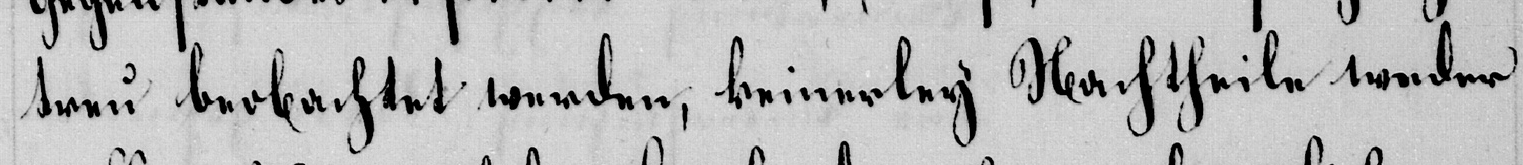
treu beobachtet werden, keinerley Nachtheile weder
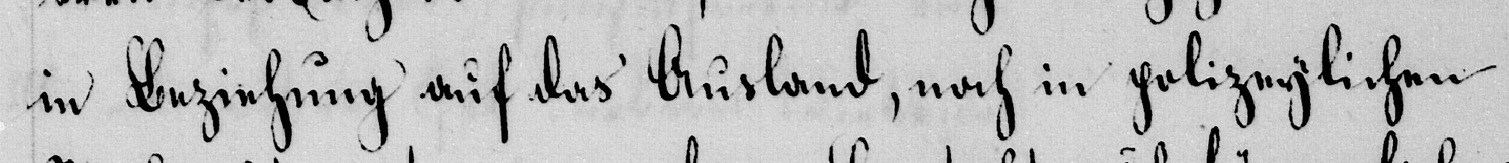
in Beziehung auf das Ausland, noch in polizeylichen
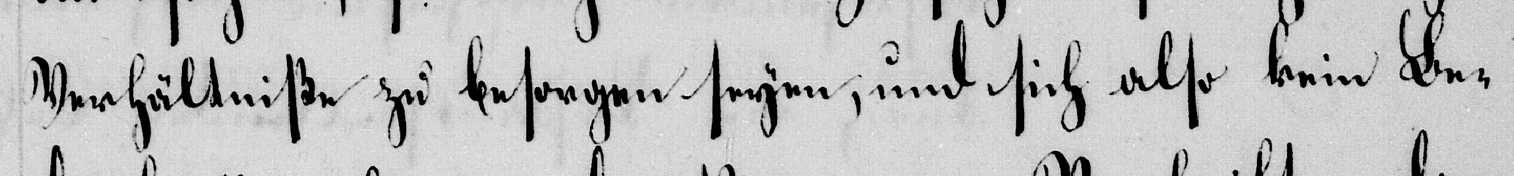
Verhältniße zu besorgen seyen, und sich also kein Be¬
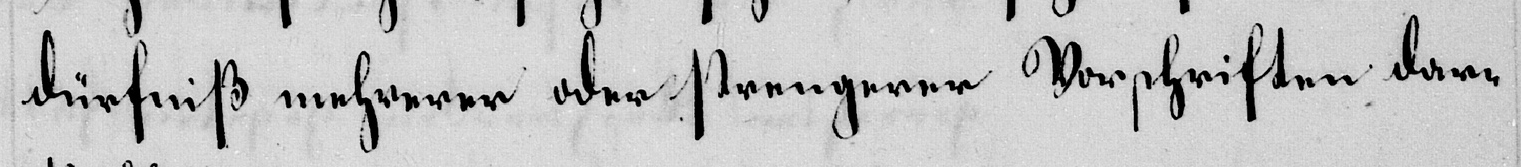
dürfniß mehrerer oder strengerer Vorschriften dar¬
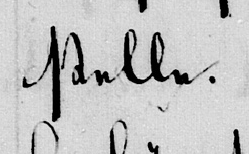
stelle.
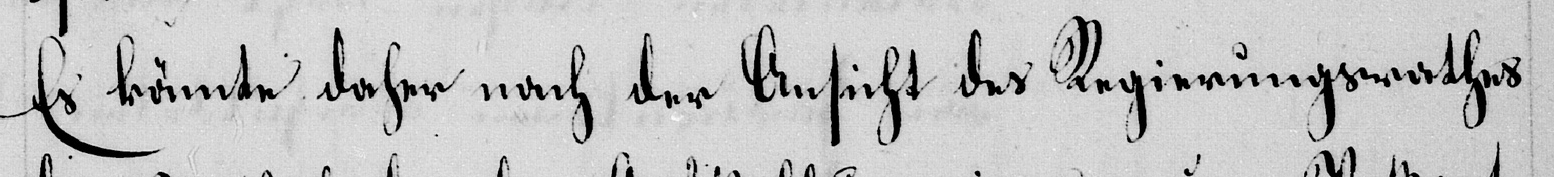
Es könnte daher nach der Ansicht des Regierungsrathes
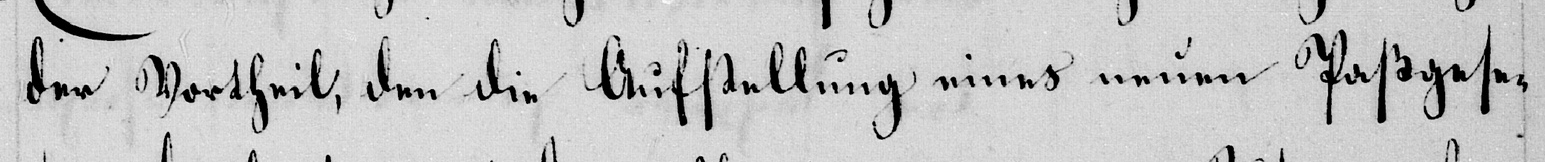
der Vortheil, den die Aufstellung eines neuen Paßgese¬
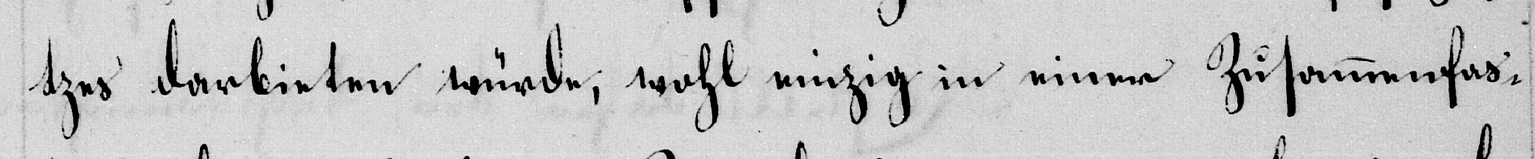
tzes darbieten würde, wohl einzig in einer Zusammenfas¬
